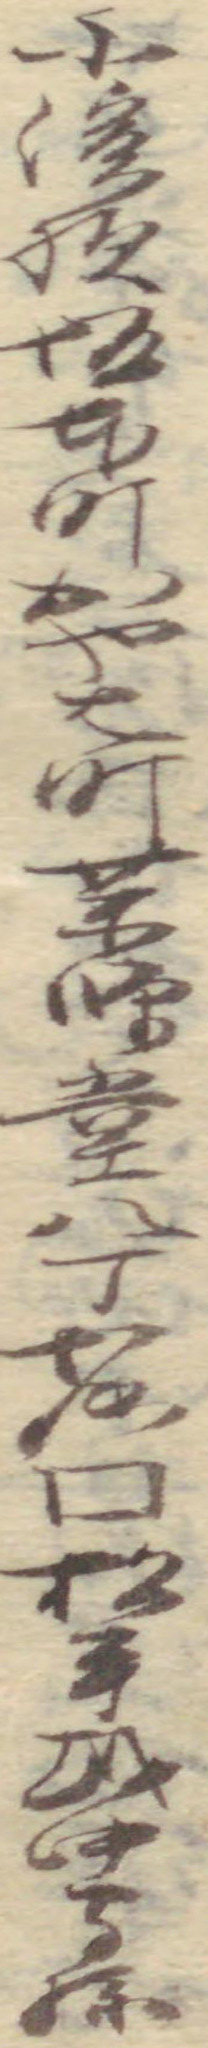小濱様坂本町かやは町薬師堂八丁堀松平越中守様
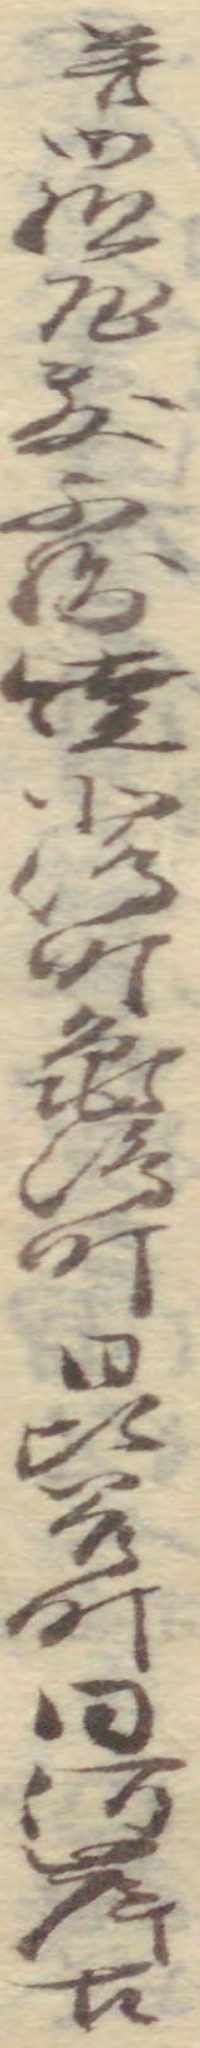幷御組屋敷不残焼北嶋町亀嶋町日比谷町同河岸古
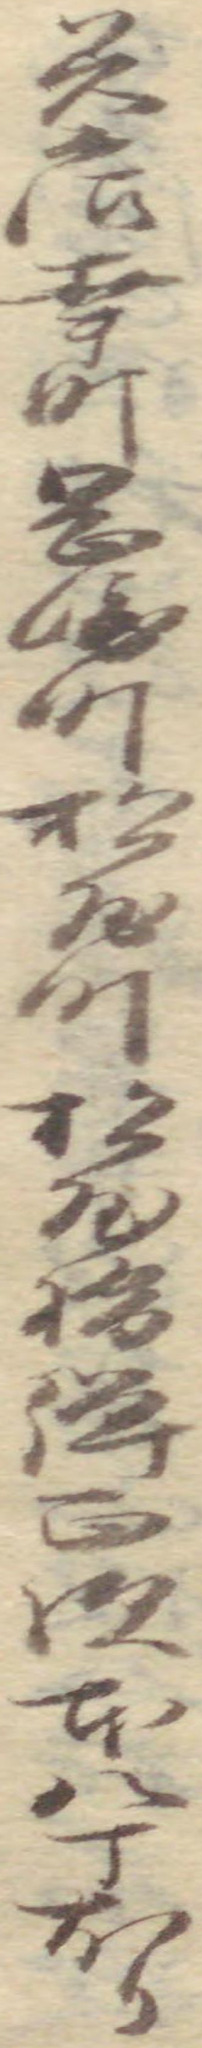着店幸町岡崎町松屋町松屋橋弾正様本八丁ほり
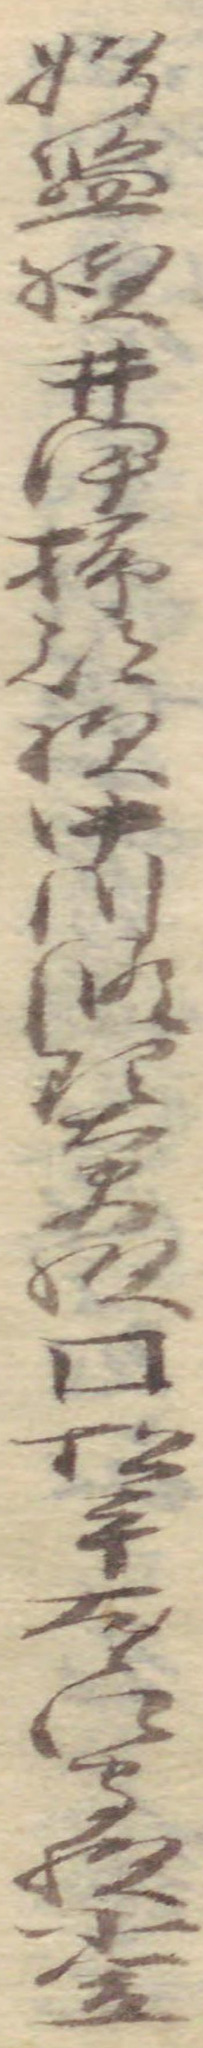将監様井伊掃部様中川修理大夫様松平遠江守様小笠
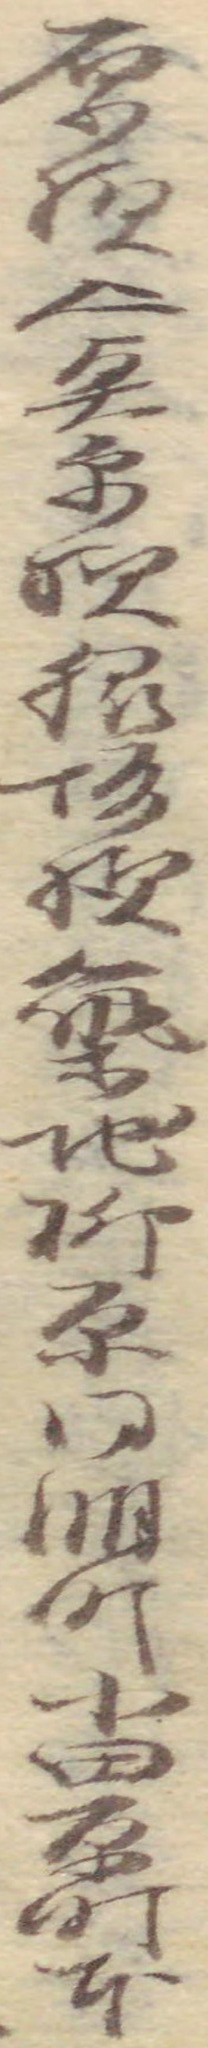原様△奥平様脇坂様築地柳原同朋町小田原町本
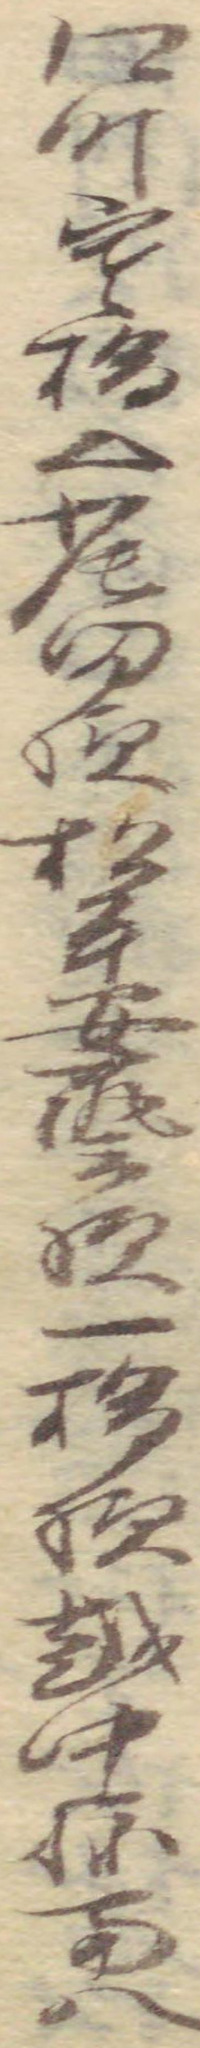郷町寒橋△堀田様松平安芸様一橋様越中様南八
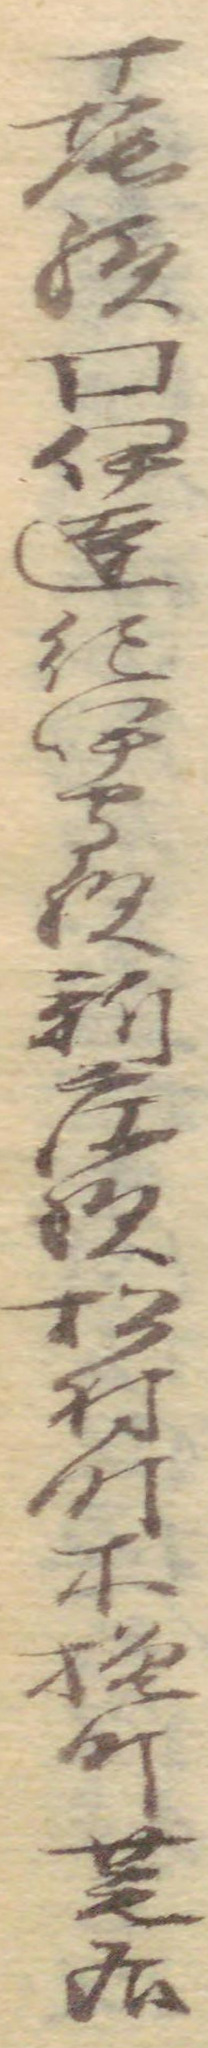丁堀様伊達紀伊守様新庄様松村町木挽町荒居

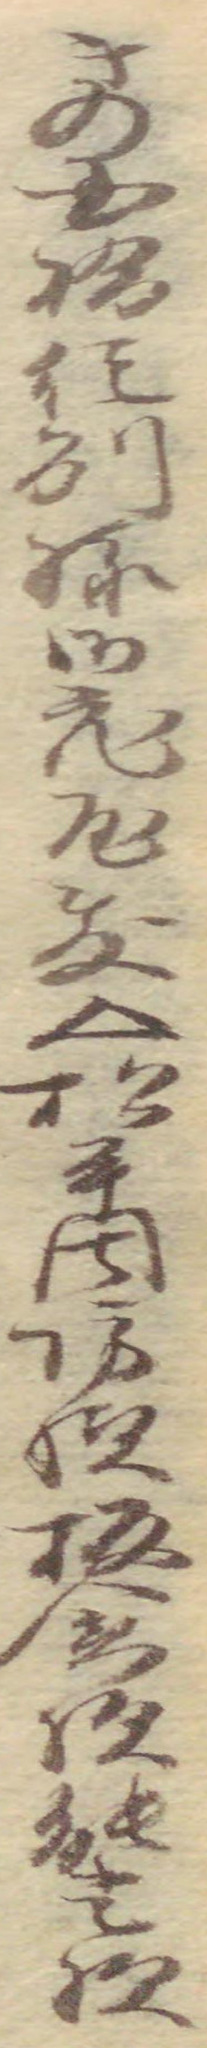きの国橋紀州様御藏屋敷△松平周防様板倉様能登様
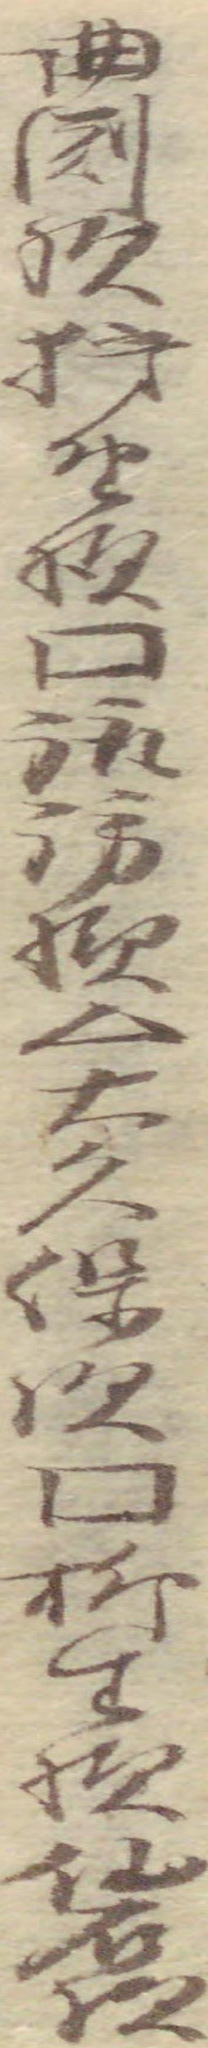曲渕様狩野様諏訪様△大久保様柳生様仙石様
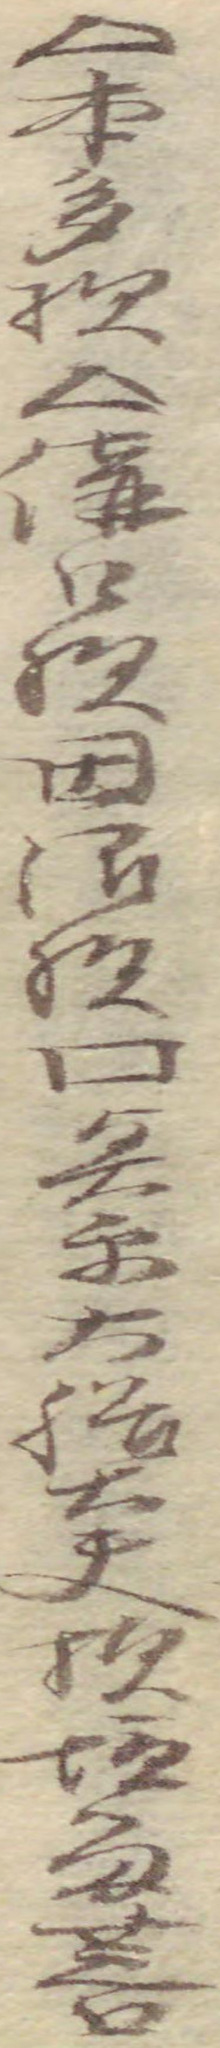△本多様△溝口様田沼様奥平大膳大夫様垣留芝口
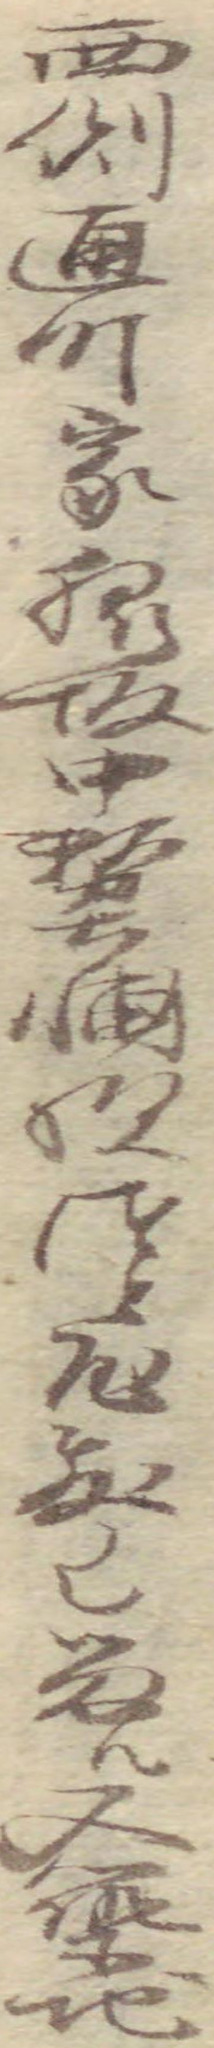西側通町家脇坂中務大輔様御用屋敷ニて留ル又築地
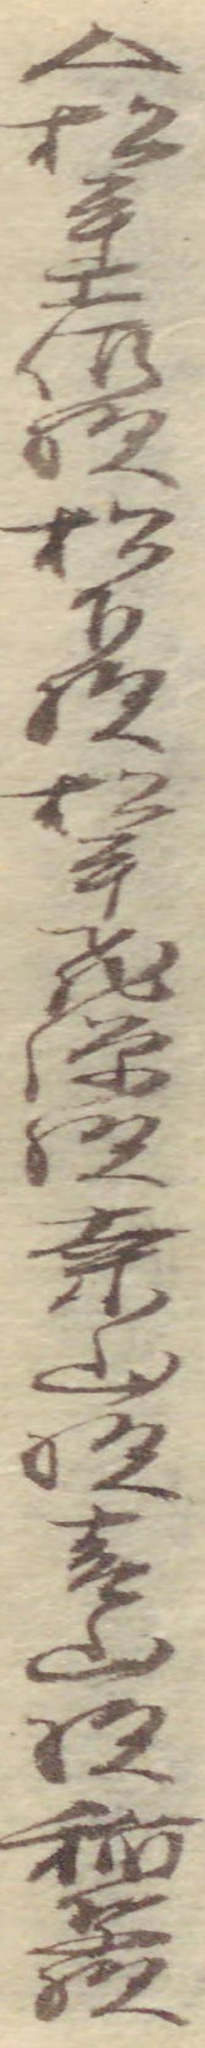△松平土佐様松下様松平飛騨様桑山様青山様稲葉様
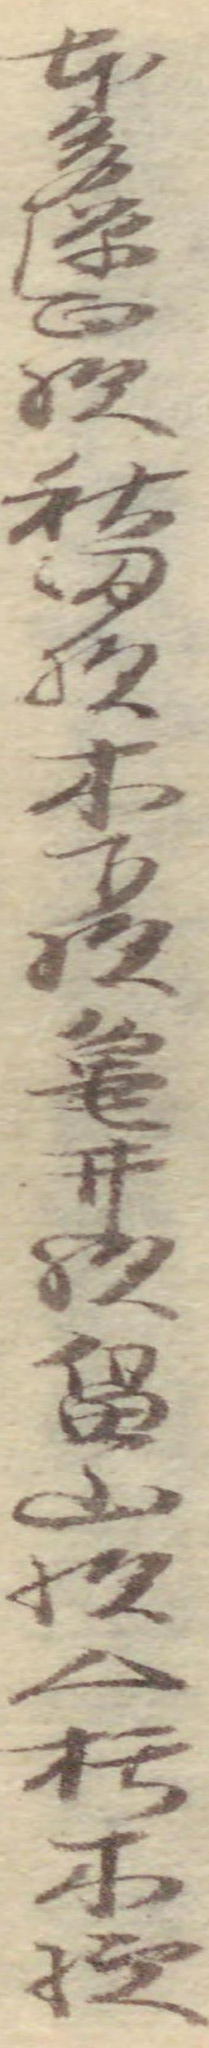本多弾正様秋田様木下様亀井様畠山様△朽木様
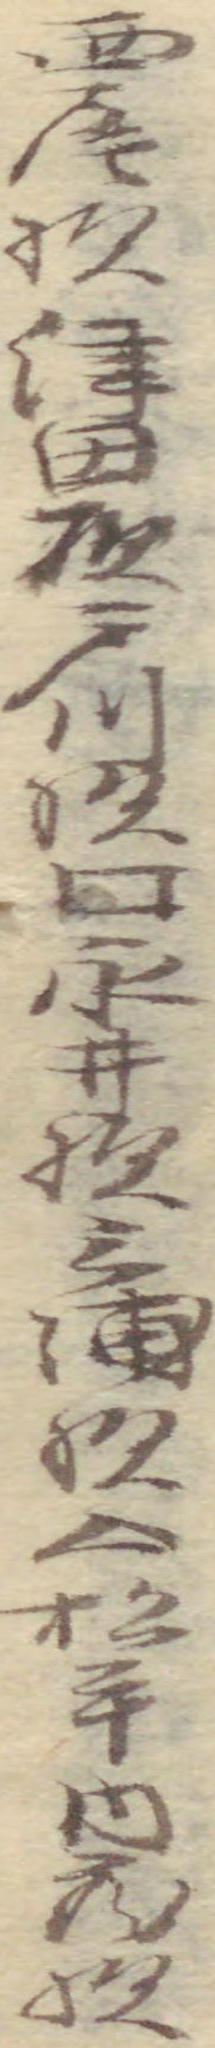西尾様津田様戸川様永井様三浦様△松平内藏様
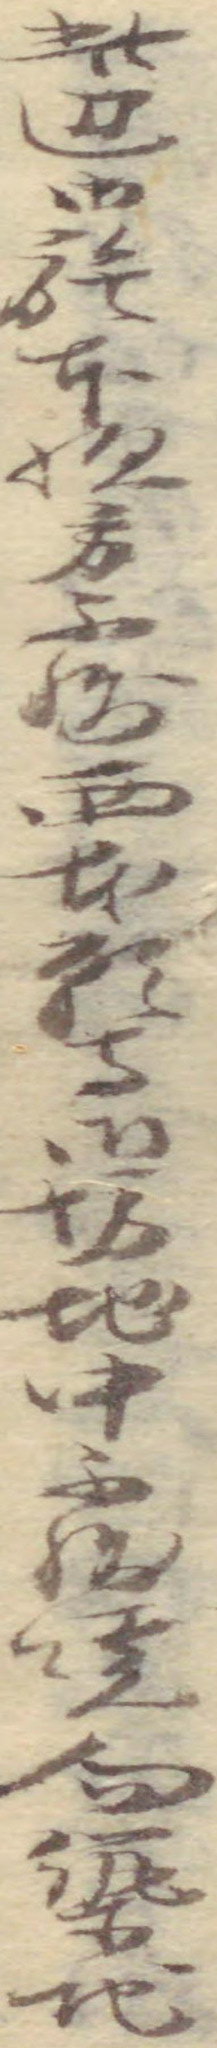此辺御旗本様方不残西本願寺御坊地中不残焼向築地
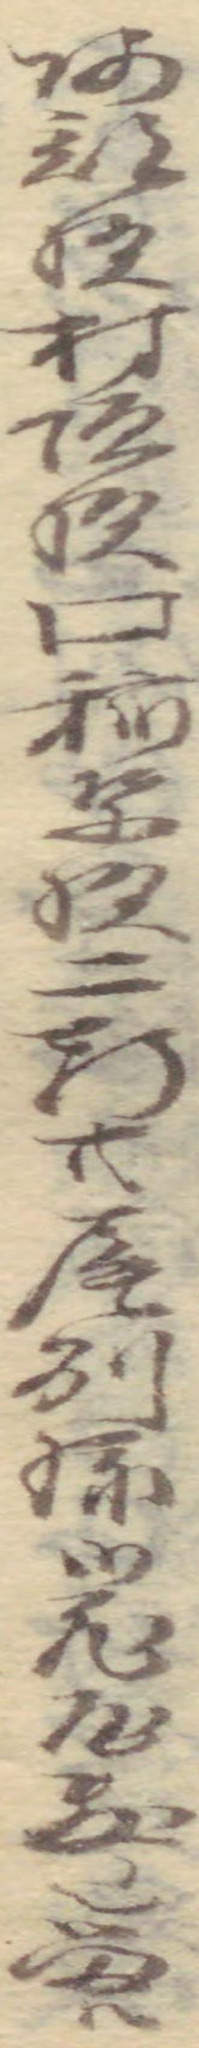阿部様村垣様稲葉様二軒共尾州様御藏屋敷ニて留ル
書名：鶯宿雑記. 巻199-200
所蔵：国立国会図書館 National Diet Library, JAPAN
